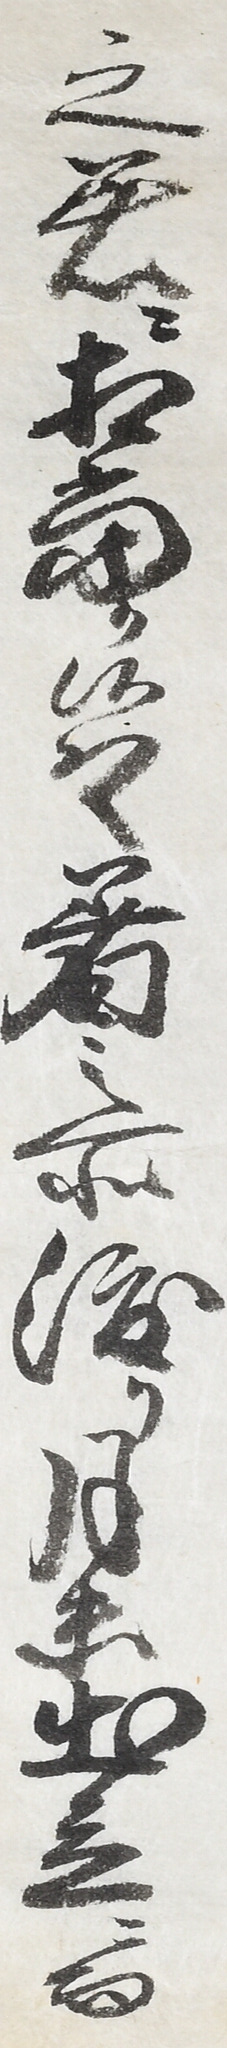之着ニ相当リ候ハヽ着之所渡リ月末出立ニ而
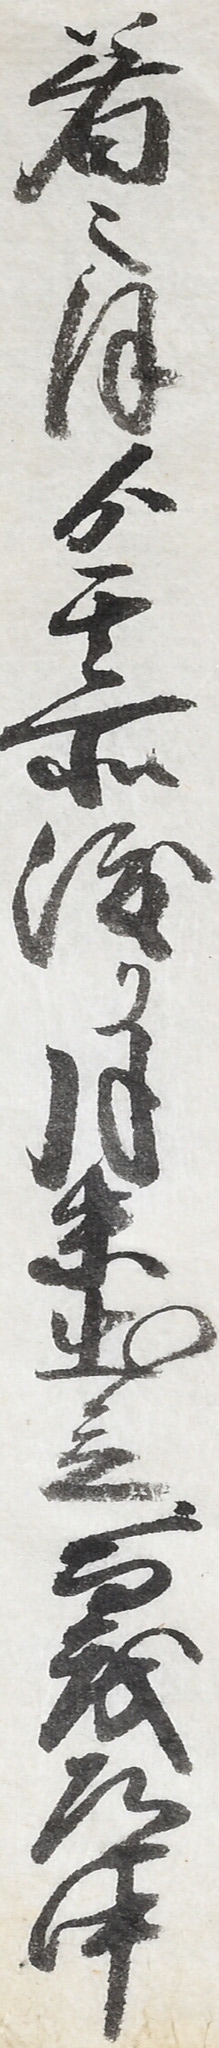着之月ゟ其所渡リ月末出立ニ而も道中
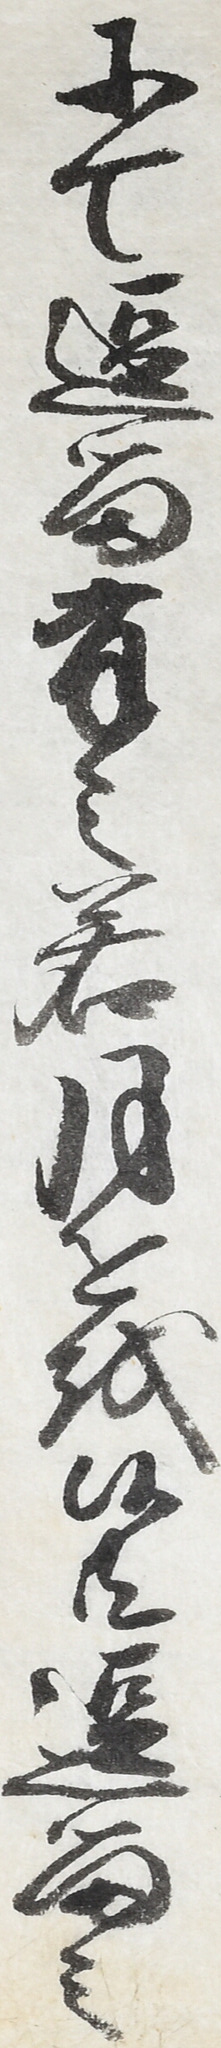にて逗留有之若月を越候共逗留之
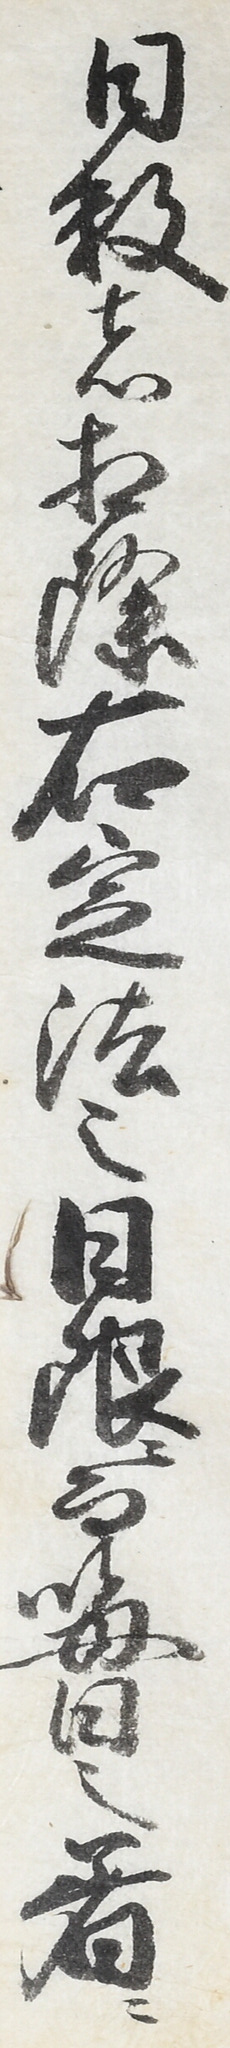日数は相除右定法之日限ニ而晦日之着ニ

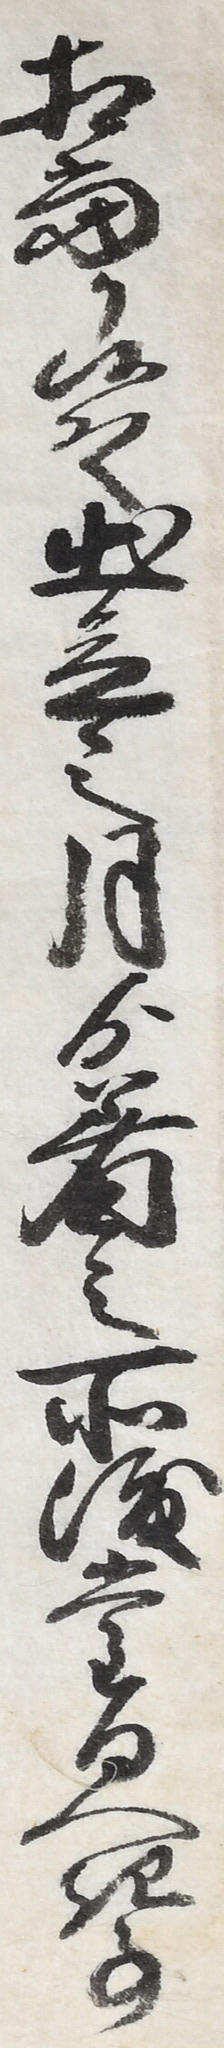相当リ候ハヽ出立之月ゟ着之所渡たるへき事
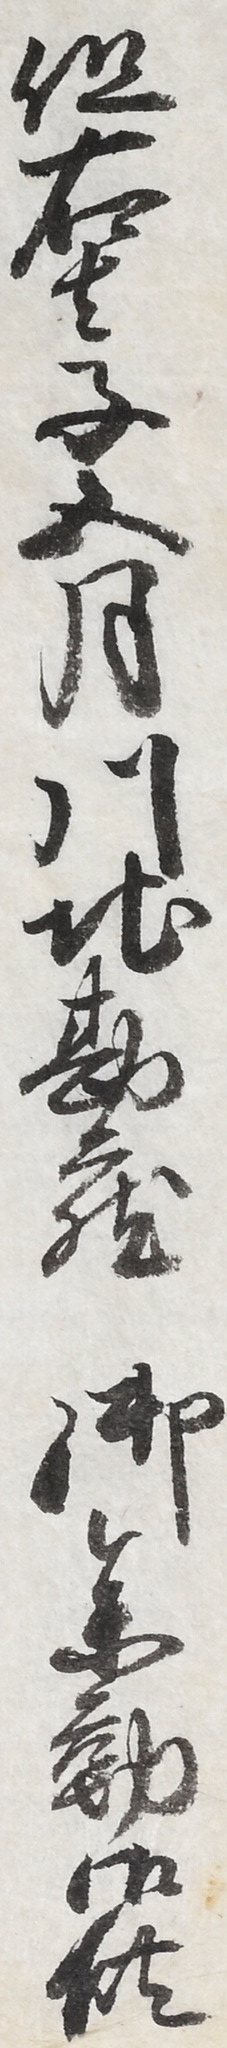但右は子五月川地勘蔵御参勤御供
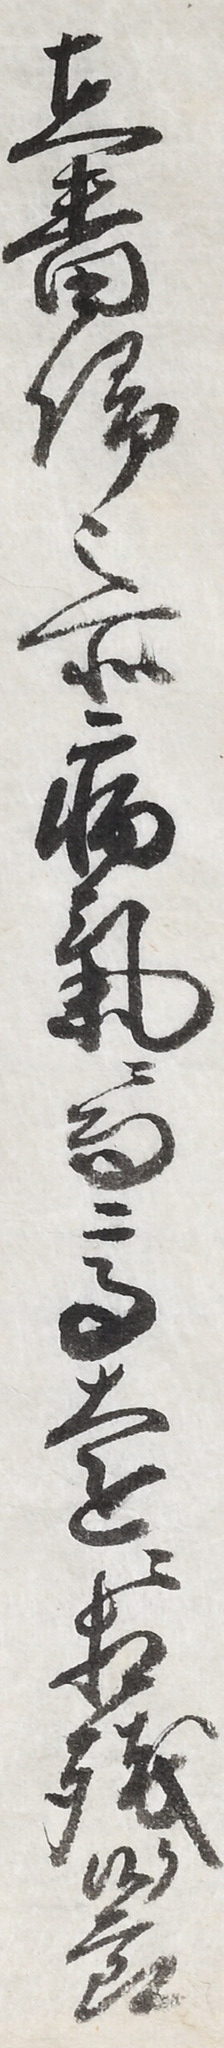在番帰之所病気ニ而高遠ニ相残リ候節
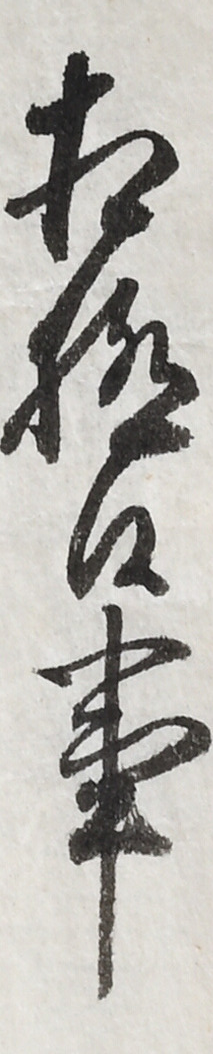相極候事
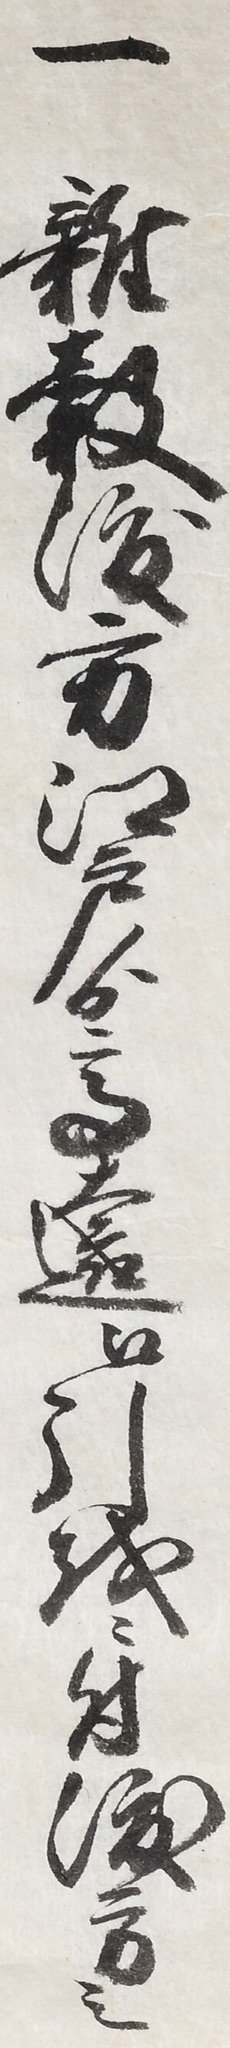一雑穀渡方江戸ゟ高遠江引越ニ付渡方之
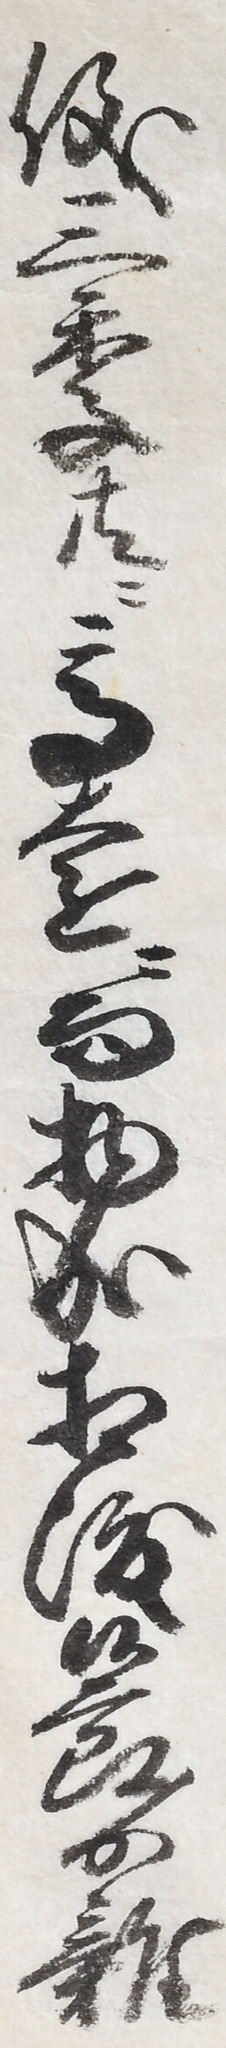儀三季共ニ高遠ニ而物成相渡候節ゟ雑
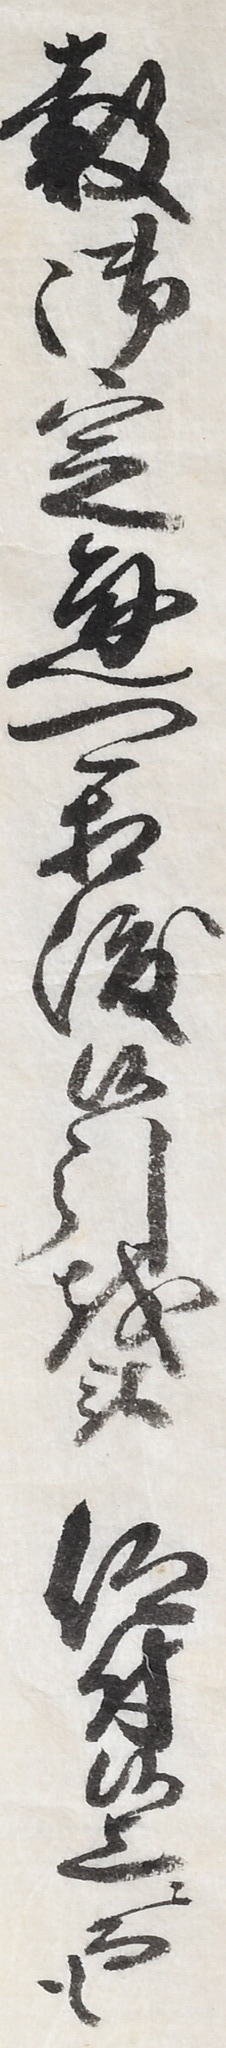穀御定通可相渡候引越被仰付候上ニ而も
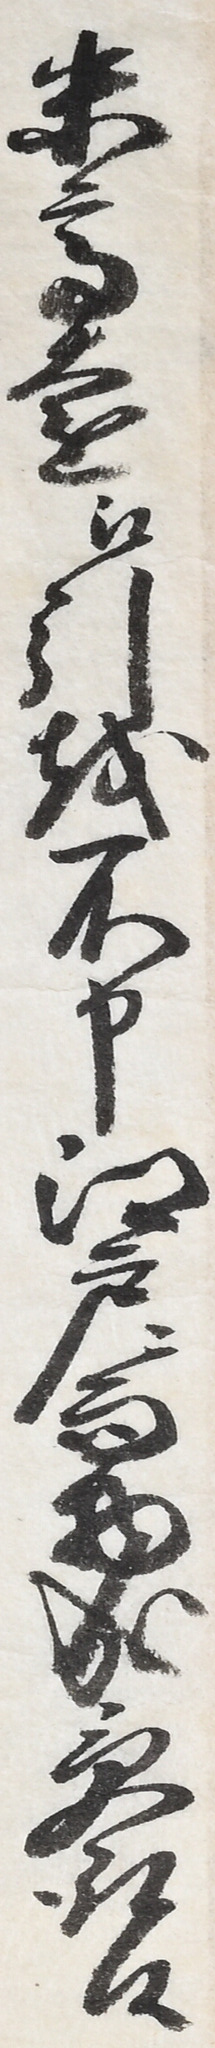未高遠江引越不申江戸ニ而物成受取候
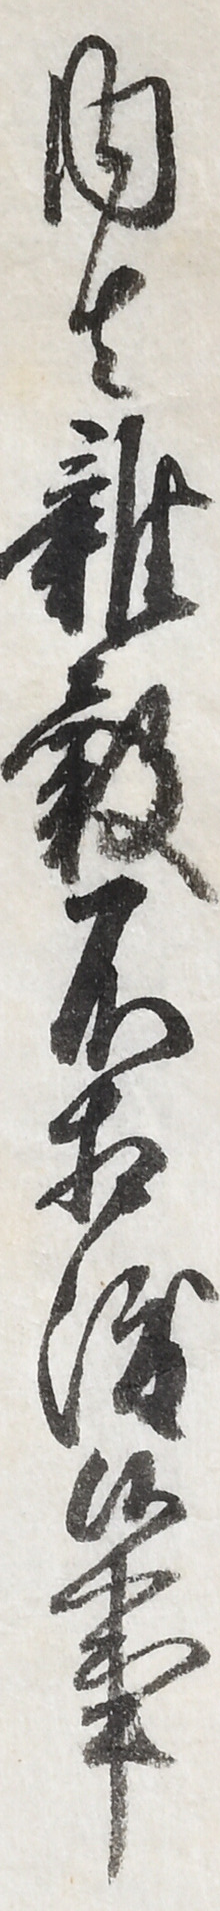内は雑穀不相渡候事
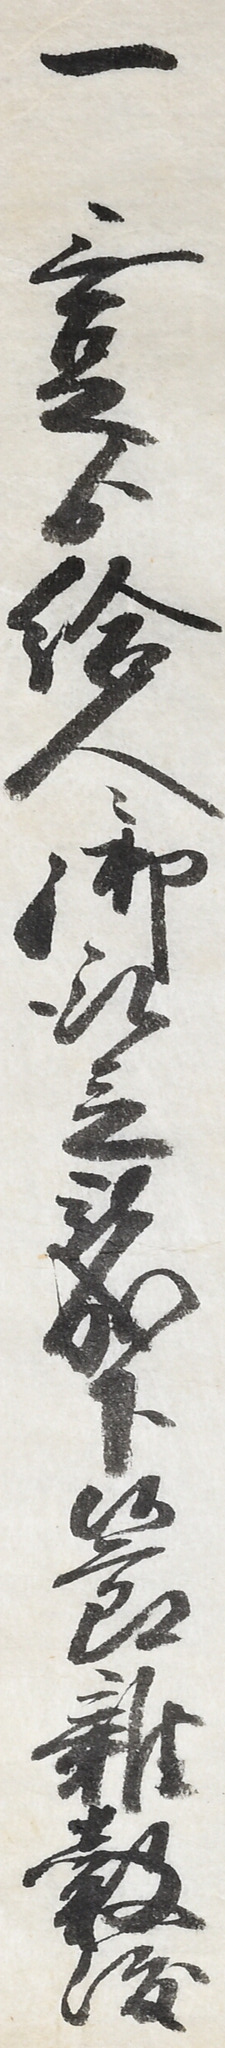一無足ゟ給人ニ御取立被成下候節雑穀渡
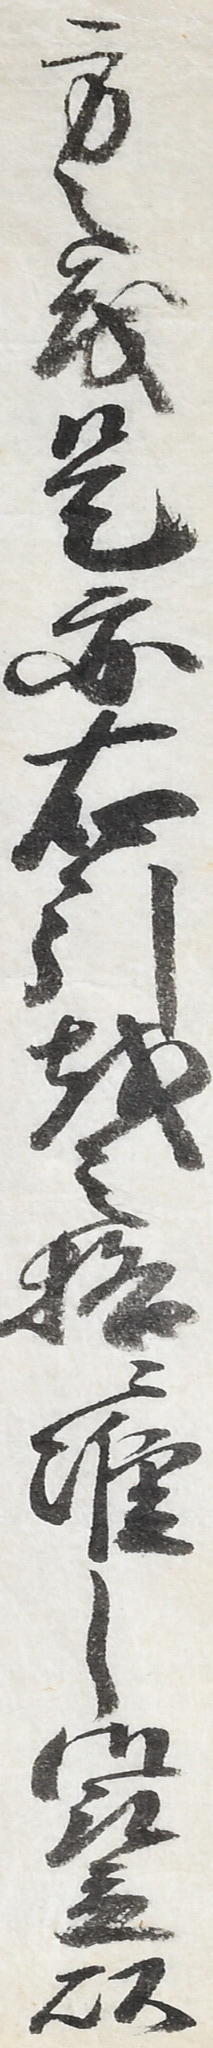方之も是亦右引越之格ニ准し御取立以
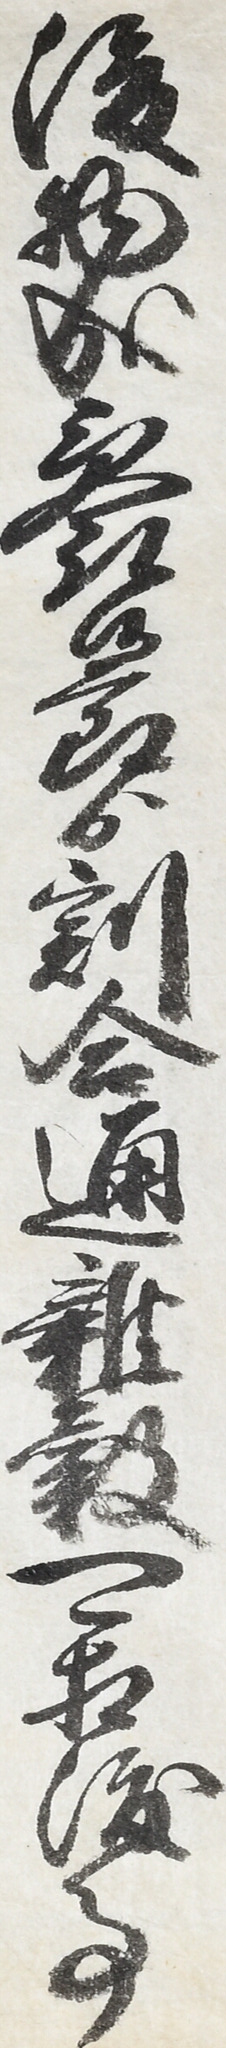後物成受取候節ゟ割合通雑穀可相渡事
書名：御給分渡り方定追加
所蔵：伊那市立高遠町図書館・合同会社AMANE
